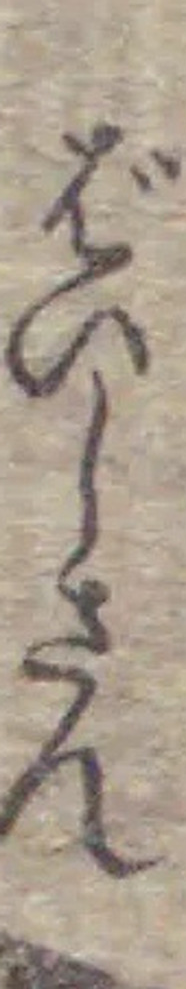ばいしさん
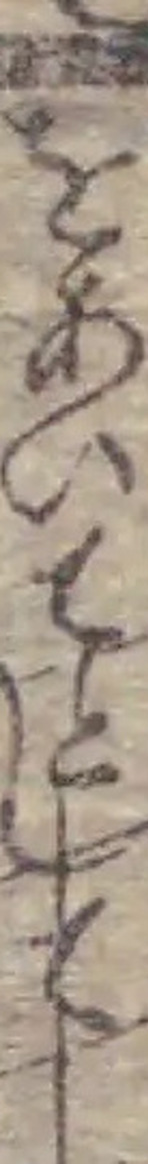をあいてとして
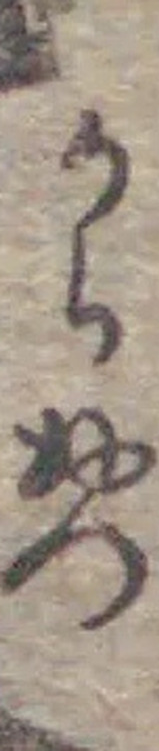からおつ
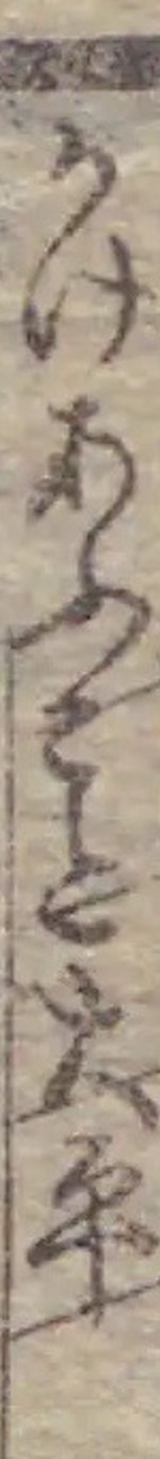うけあうこと太平
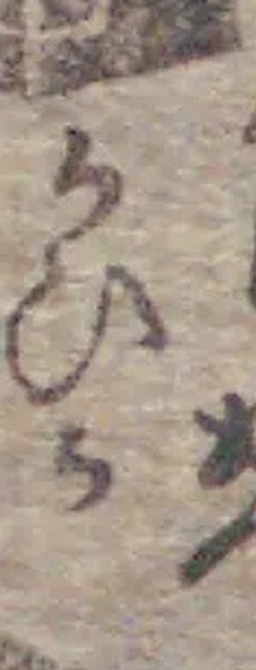かひか
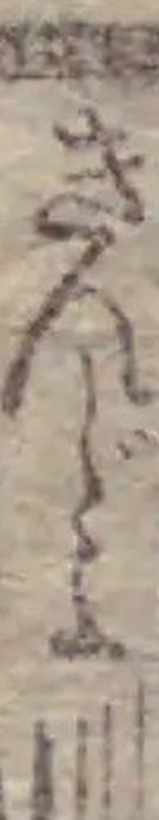きんじふ
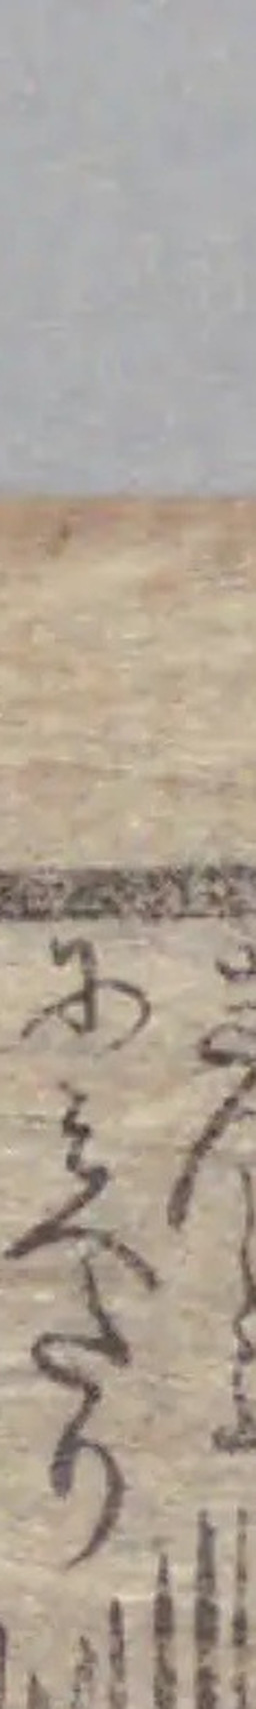にみへたり
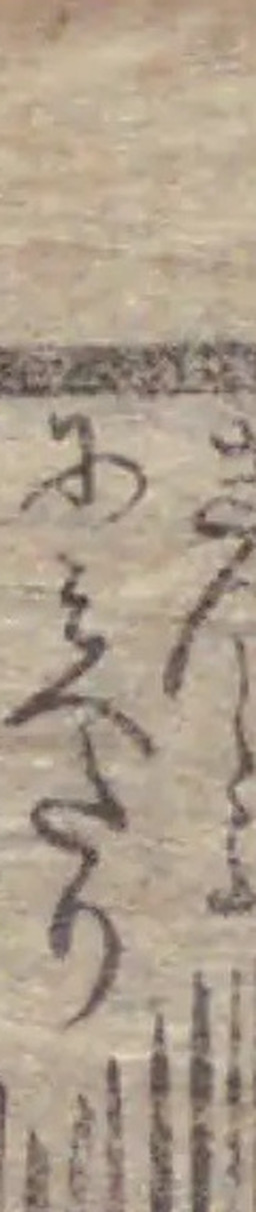にみへたり
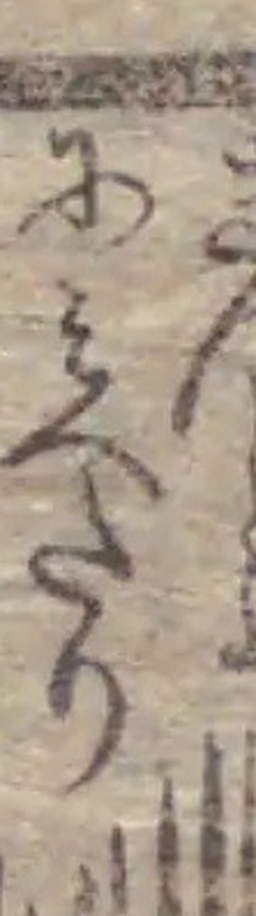にみへたり
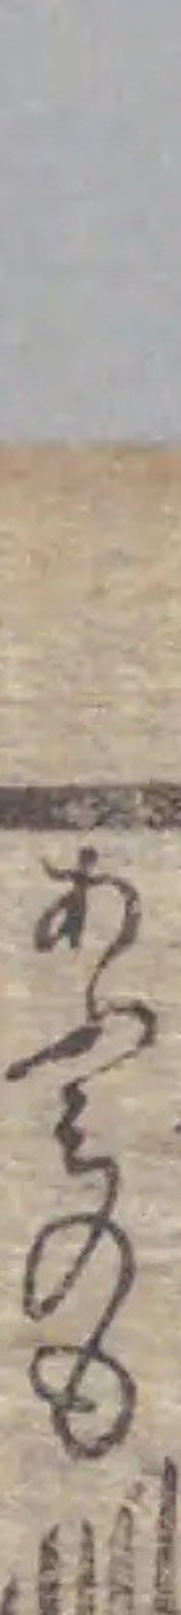あふみのも
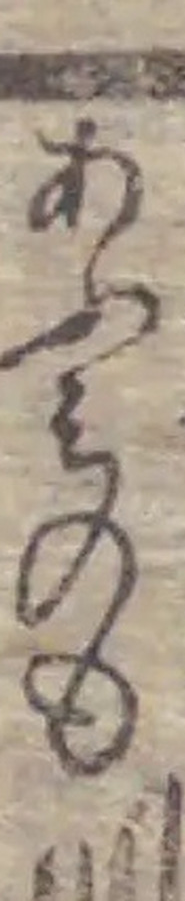あふみのも
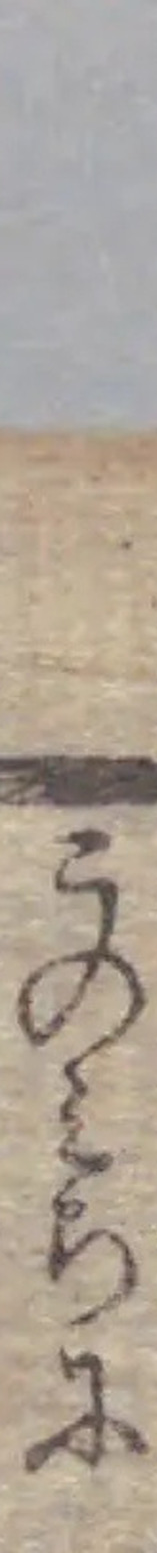このみちに
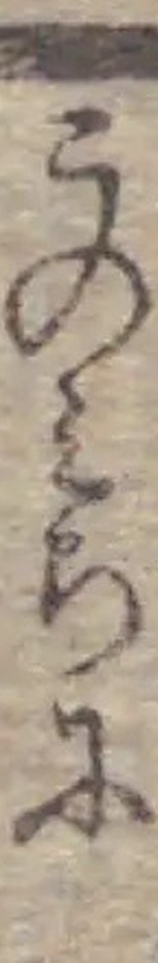このみちに
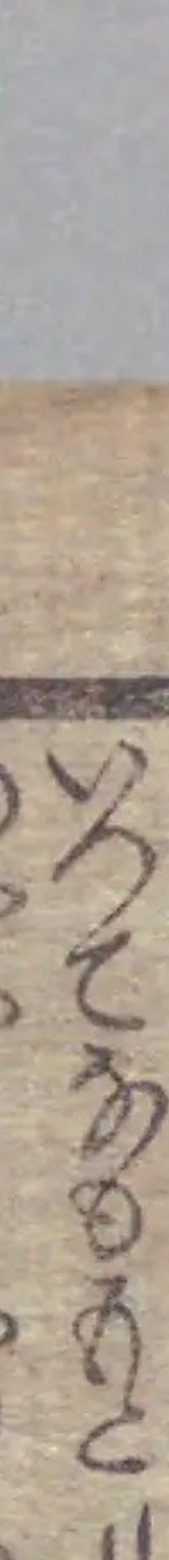いつてなも？もと
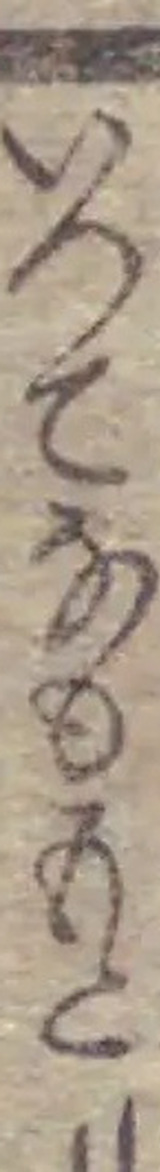いつてなも？もと
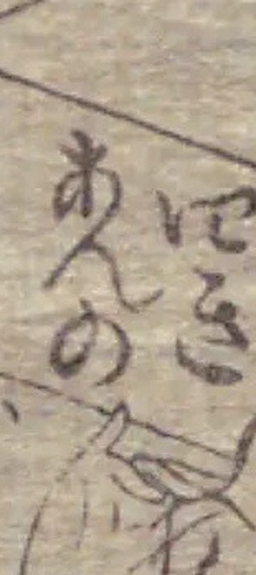あんの
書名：かんなんの夢枕 2巻
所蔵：国立国会図書館 National Diet Library, JAPAN
